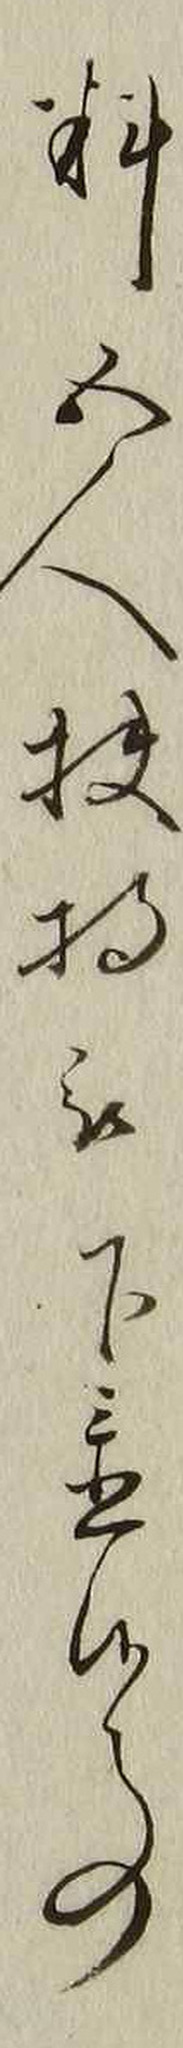料五人扶持被下置候事
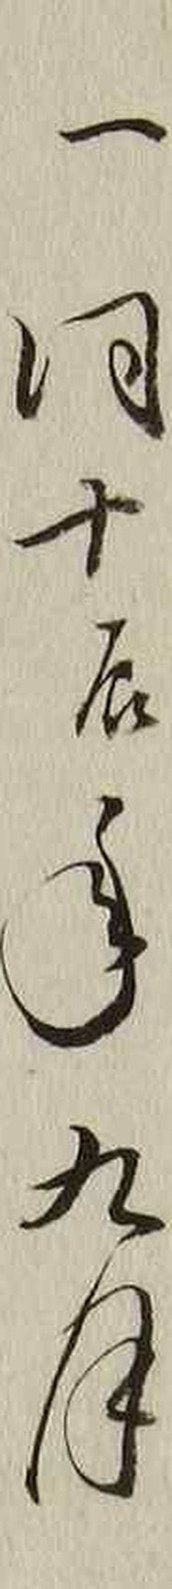一同十辰年九月
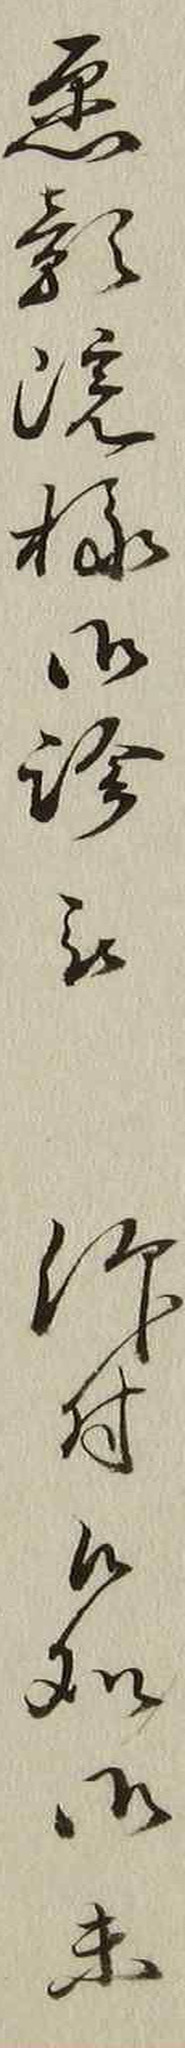影院様御診被仰付候処御未
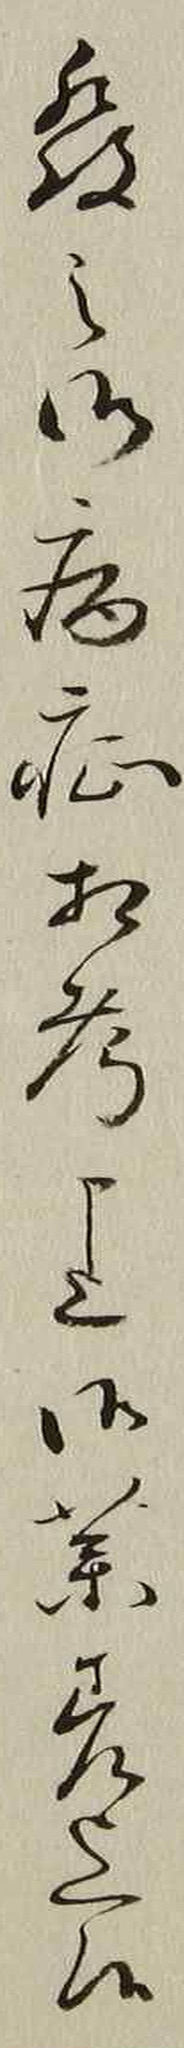発之御病症相考申上御薬差上候
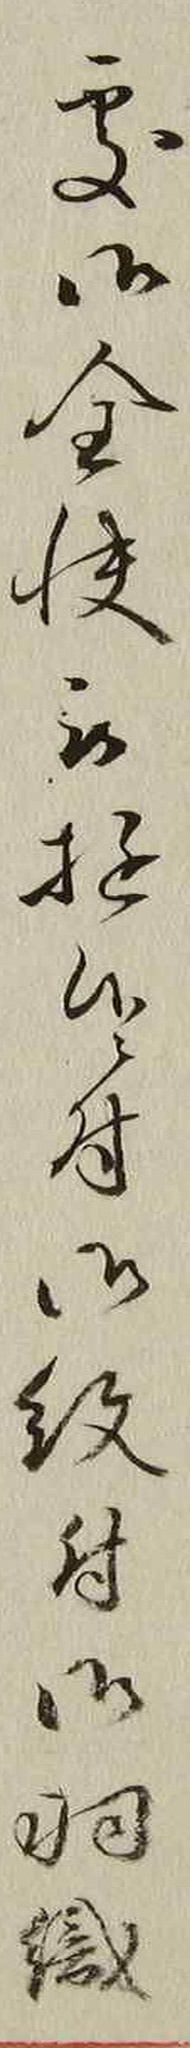処御全快被遊候ニ付御紋付御羽織
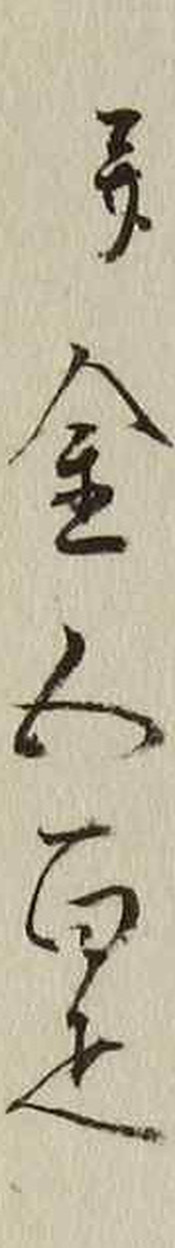并金五百疋
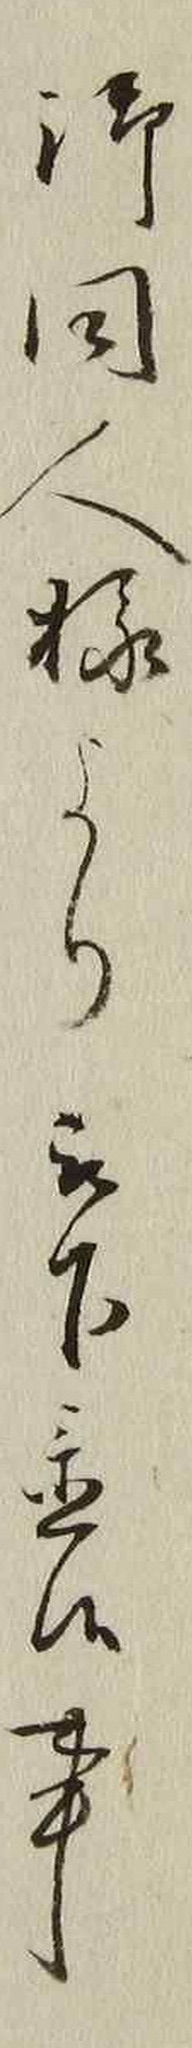御同人様より被下置候事
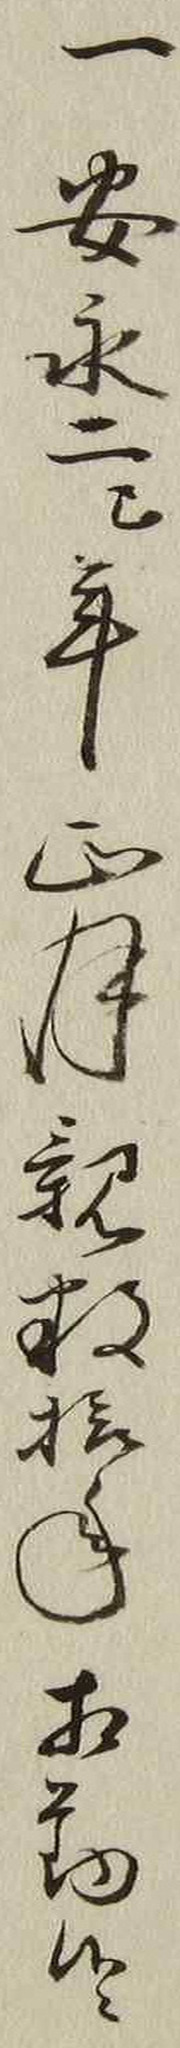一安永二巳年正月親数十年相勤候ニ
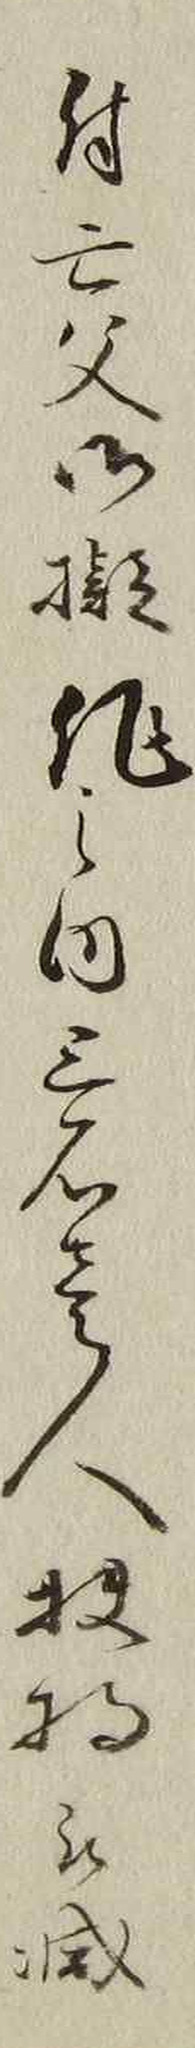付亡父御擬作之内三石壱人扶持被減
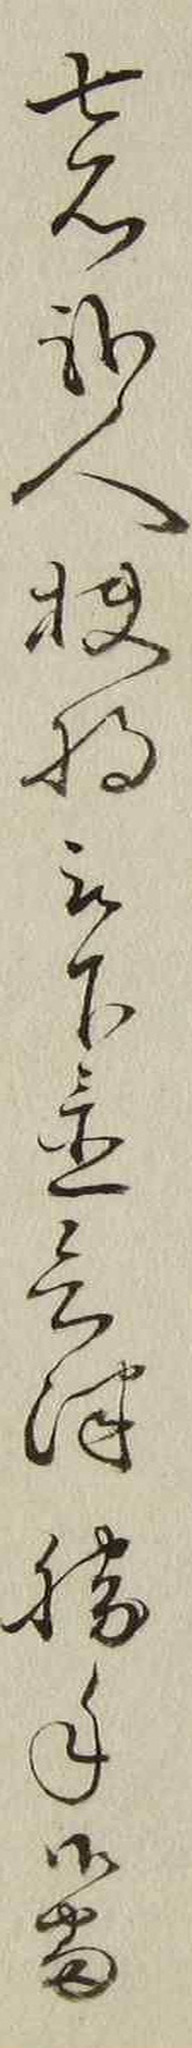七石弐人扶持被下置会津勝手御番
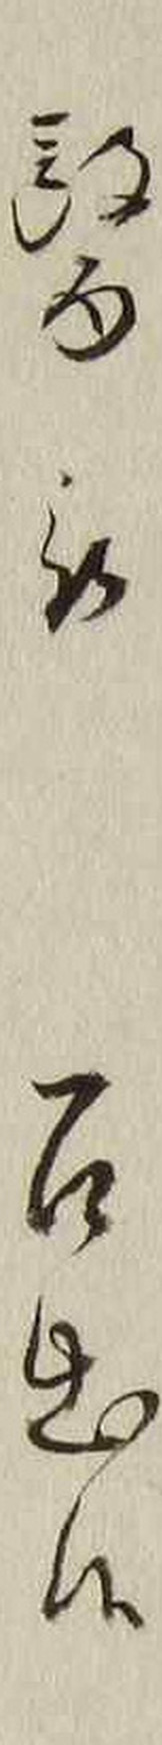医被召出候
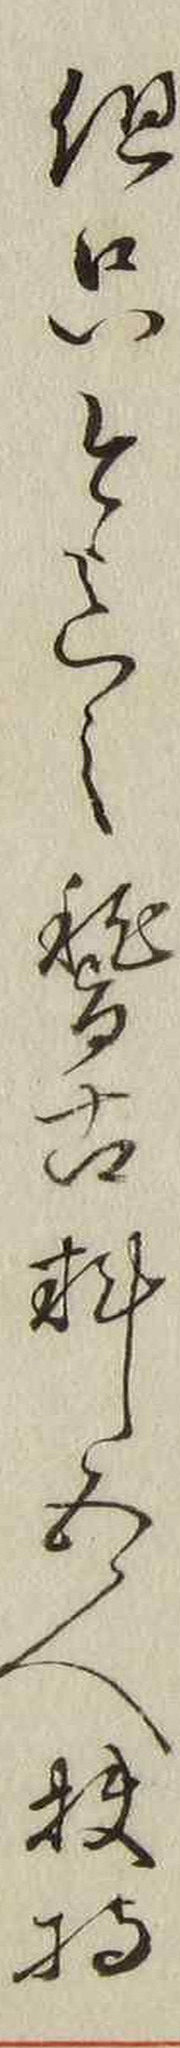但只今迄之稽古料五人扶持
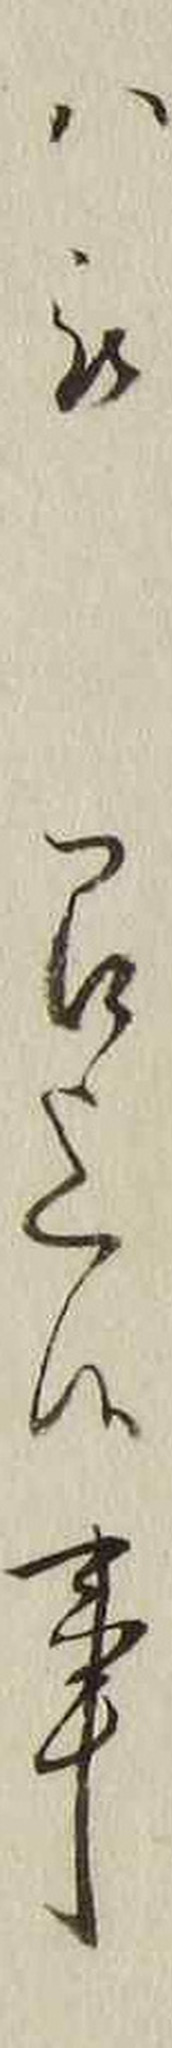ハ被召上候事
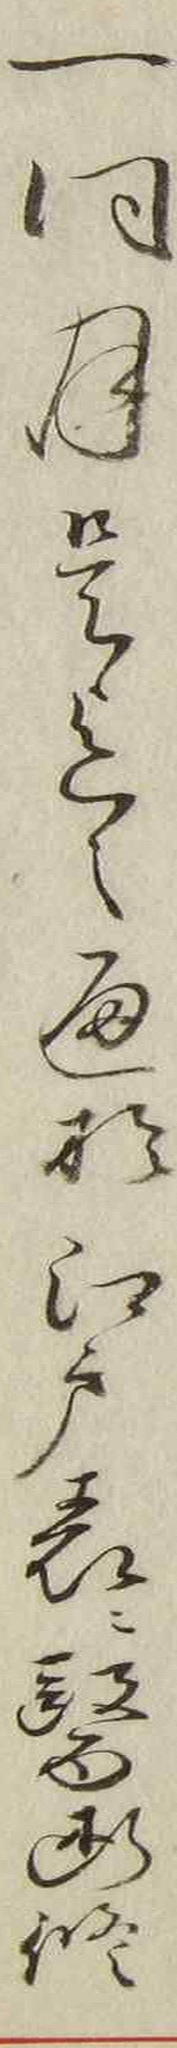一同月是迄之通於江戸表ニ医断修

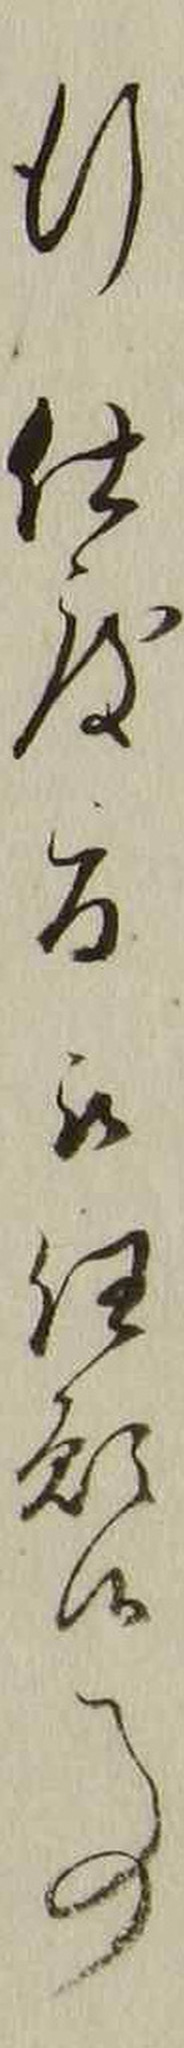行仕度旨被任願候事
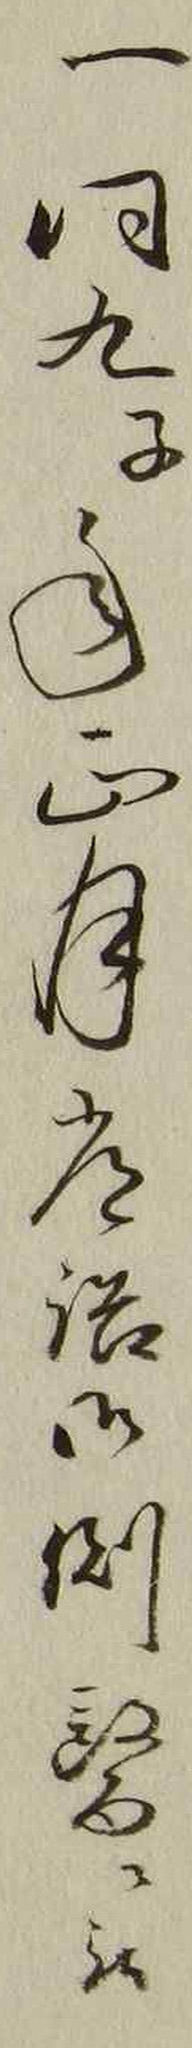一同九子年正月常詰御側医ニ被
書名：諸士系譜　巻之8　い之部8
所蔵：会津若松市立会津図書館
